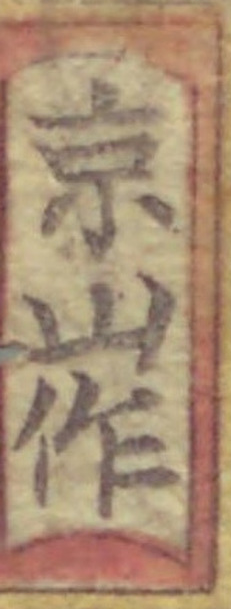京山作

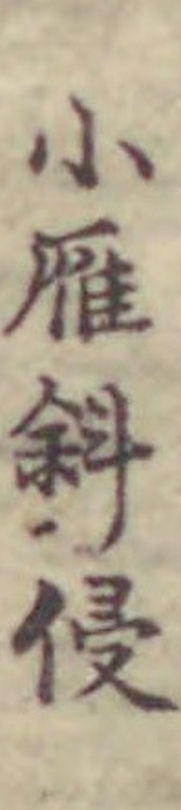小雁斜侵
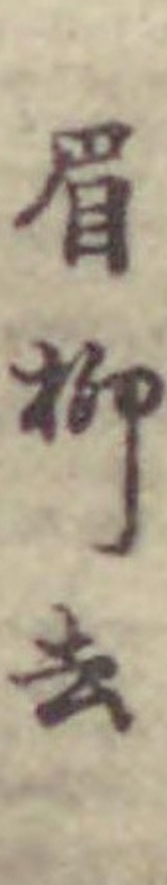眉柳去
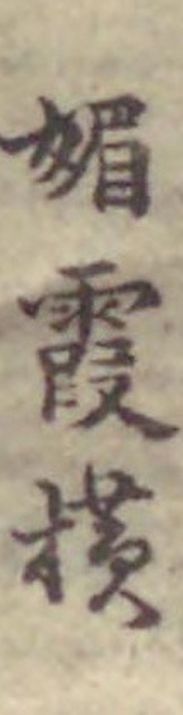媚霞横
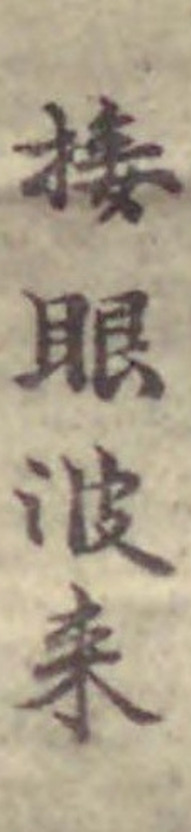楼眼波来
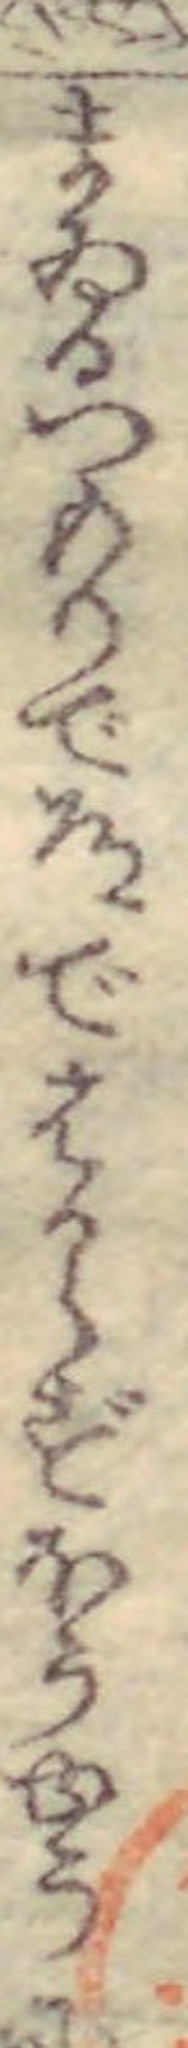まゐるつもりで道ではからずほうゆうにあひ
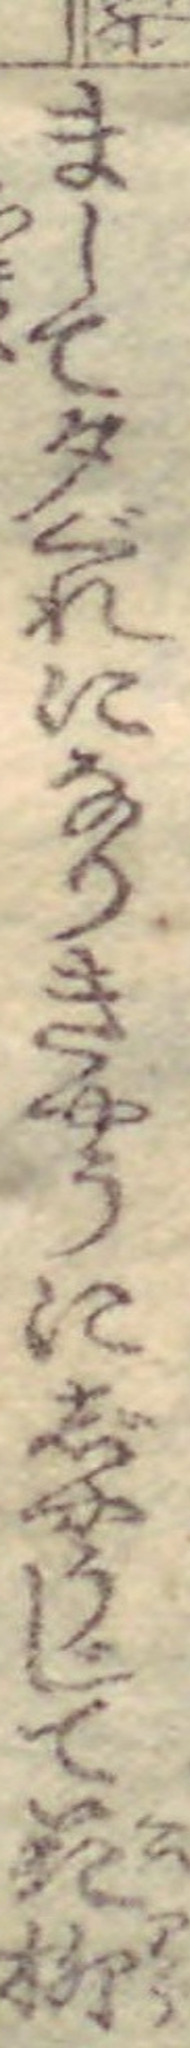まして夕ぐれになりきやうにじやうじて花柳
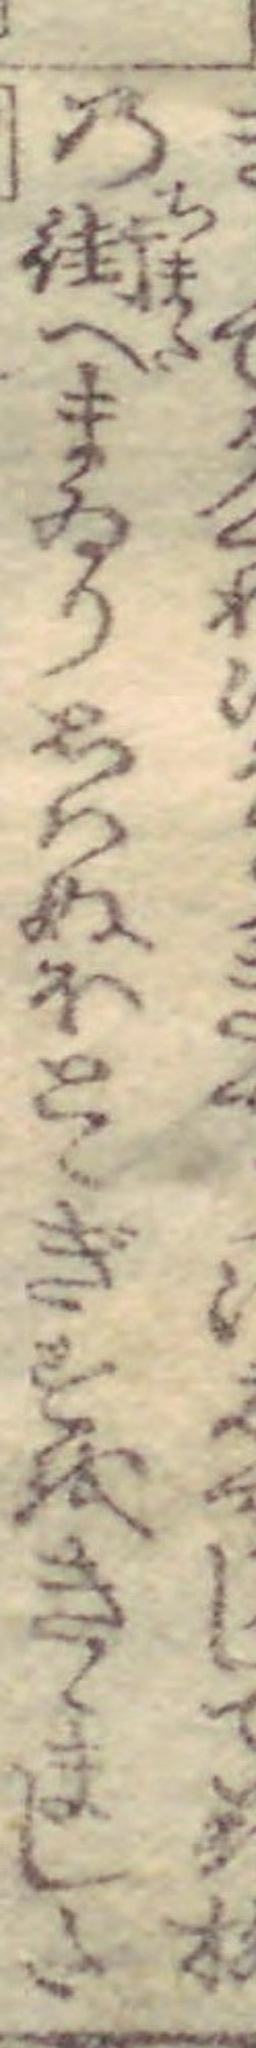の街へまゐり思はぬほとゝとぎすをきゝました
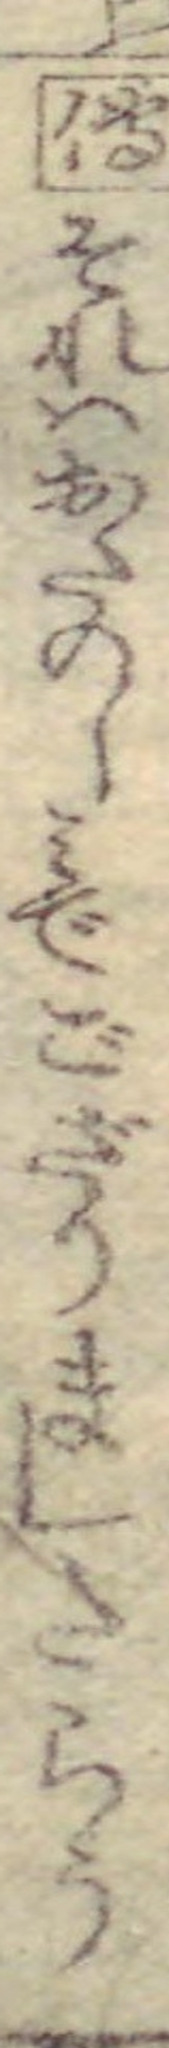[伝]それはおたのしみでござりましたらう
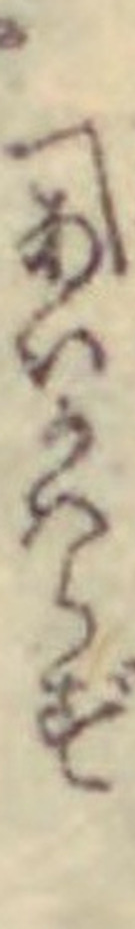〽あいかわらず
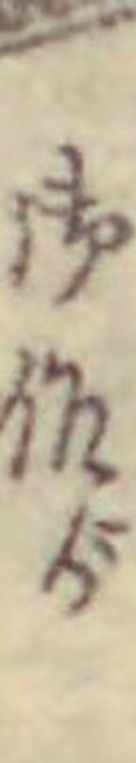御作が
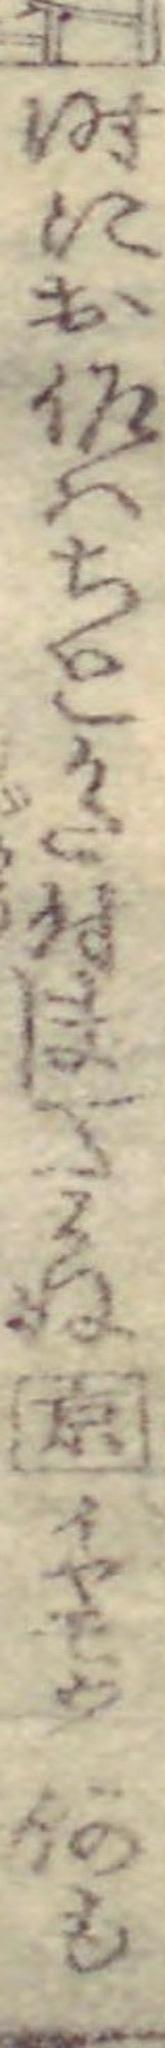時にお作はちとかた付ましたかね[京]イヤモウ何も
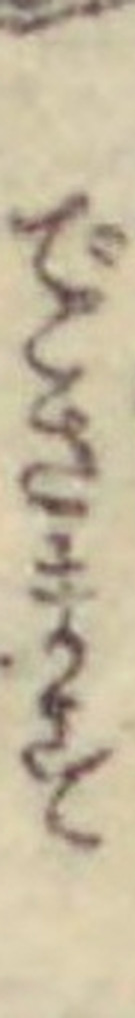できます
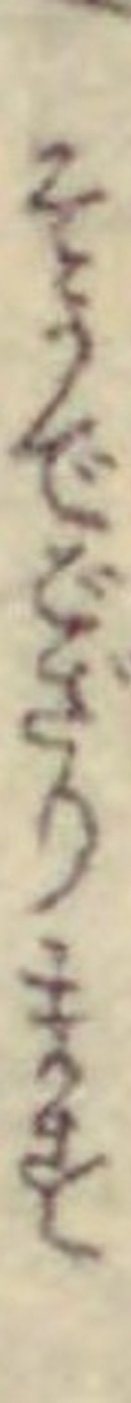そうでござります
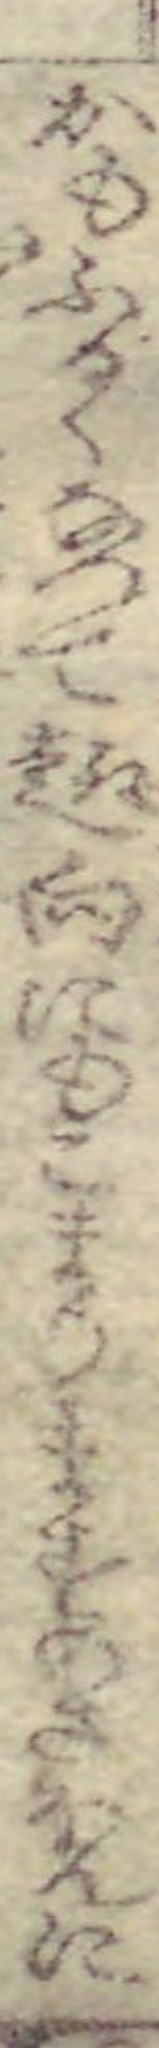かもふるくなつて趣向にもこまりますのさほんに
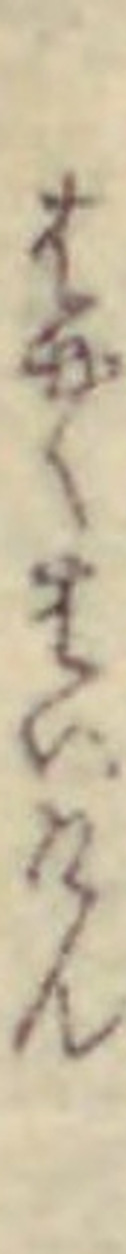はやくはいけん
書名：八ツ目鱣因縁物語 3巻
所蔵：国立国会図書館 National Diet Library, JAPAN
